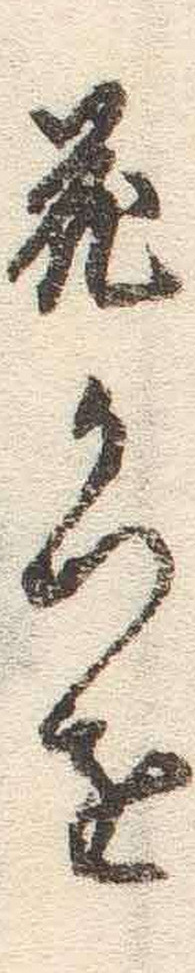花かつを
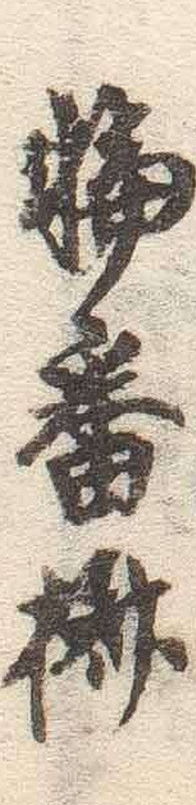輪番椒
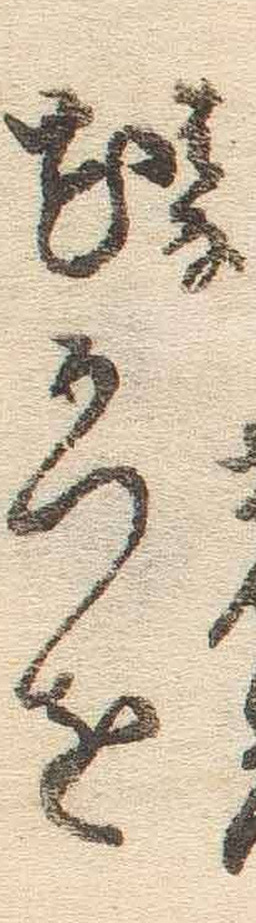花かつを
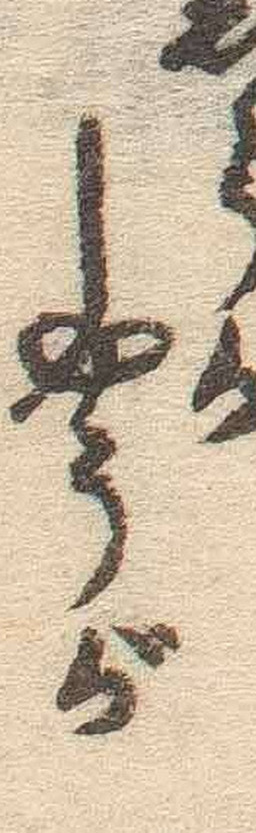しやうが

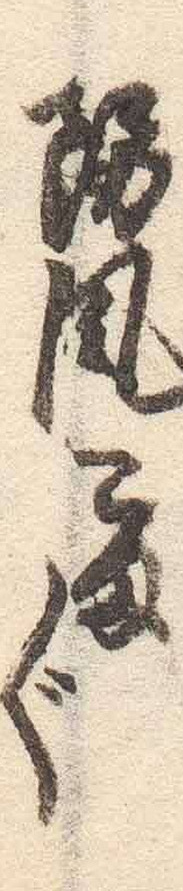防風こま〴〵花
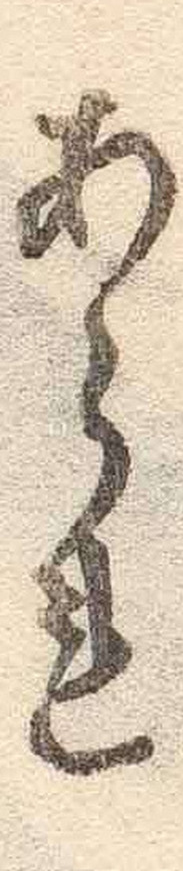あられ
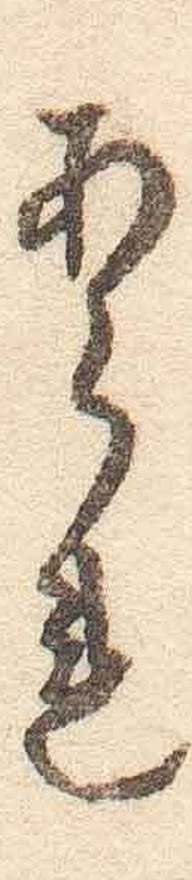あられ

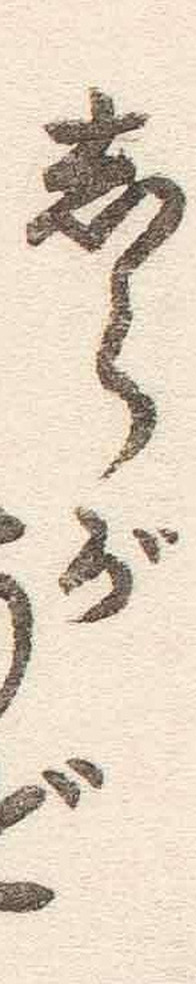しらがぎり
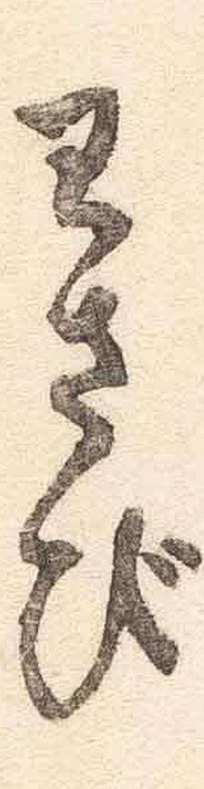わさび
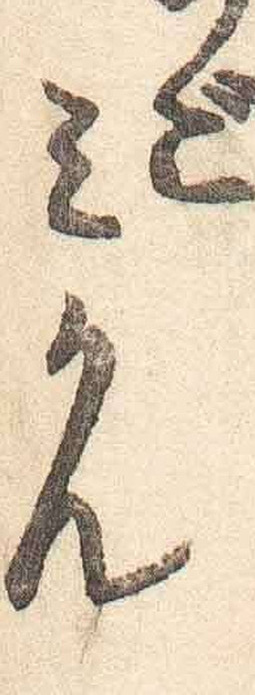みかん
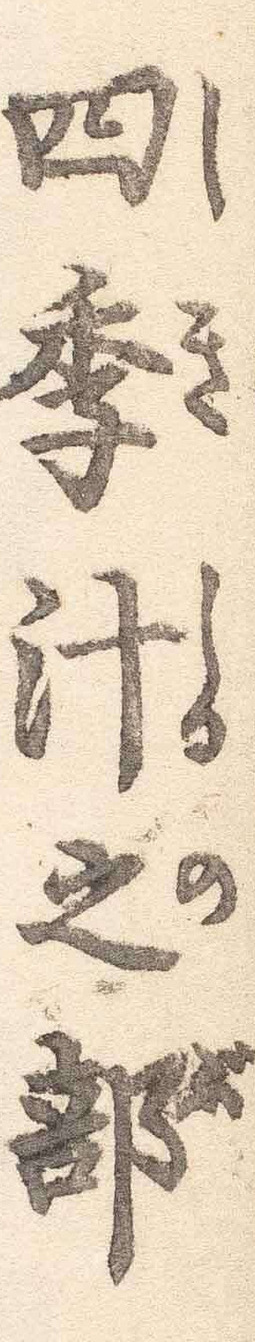四季汁之部
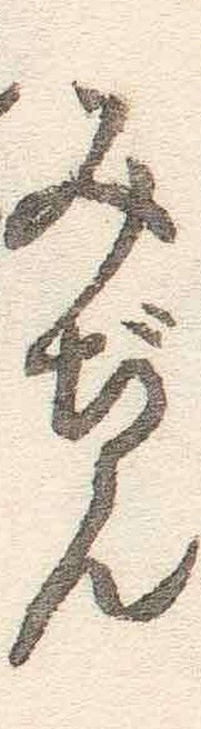みかん
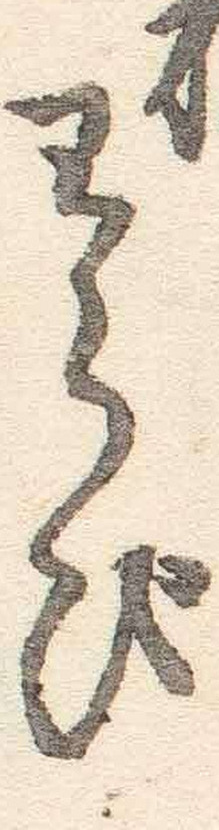わさび
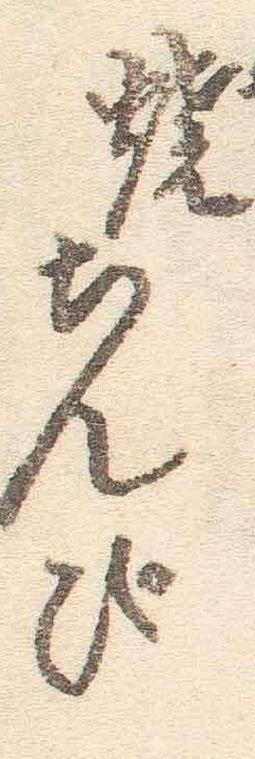ちんぴ

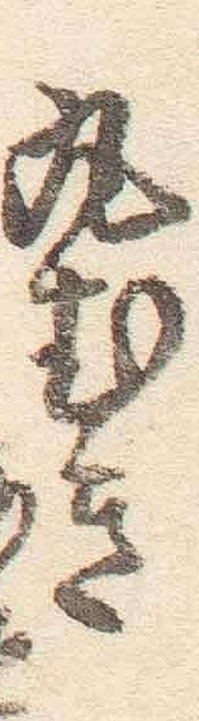粉むき
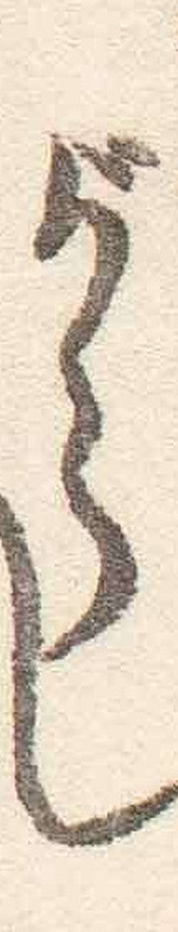がらし
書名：料理通
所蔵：東京学芸大学附属図書館 国文学研究資料館
